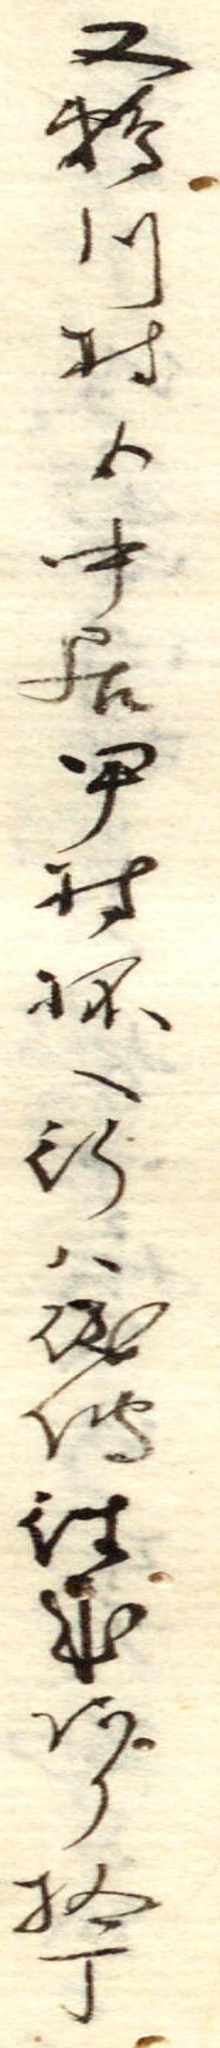又鵜川村ゟ中居甲村抔へ行は礒伝往来あり拾丁

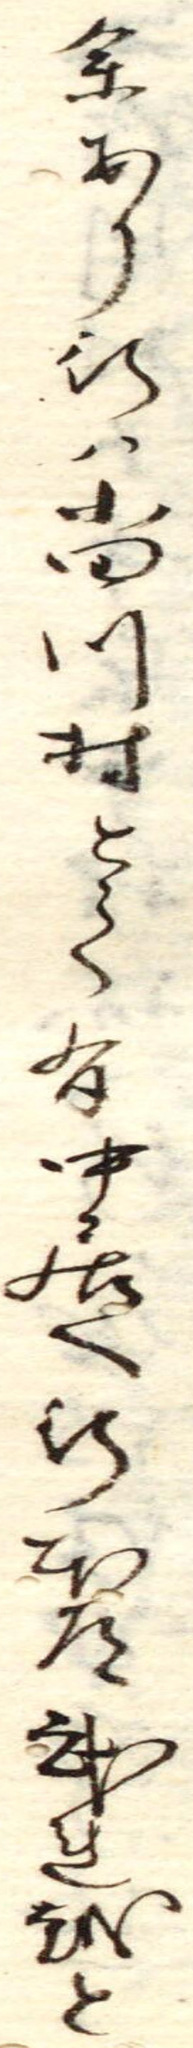余あり行は小田川村とて有中居へ行本道武連越と
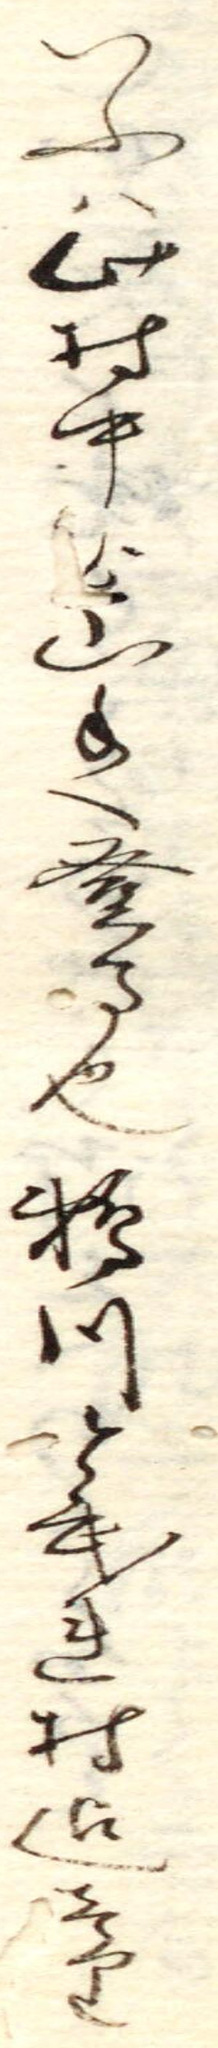いふは此村中ゟ山手へ登る也鵜川と武連村迄壱里
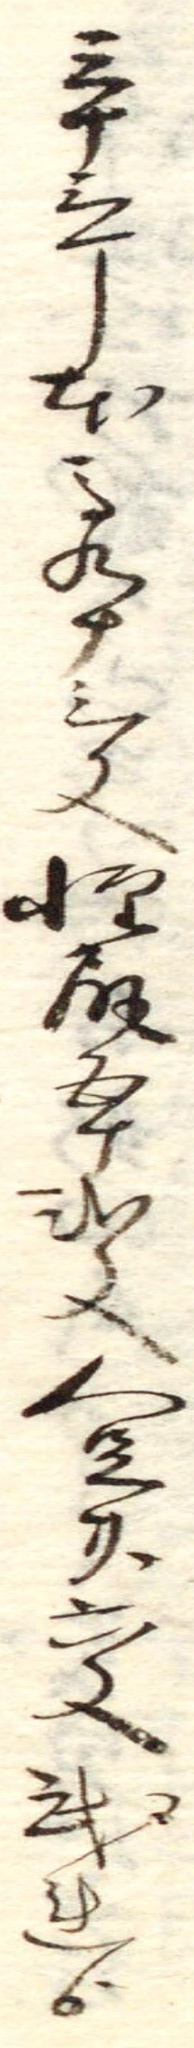三十三丁本馬九十三文軽尻五十弐文人足廿六文武連ゟ
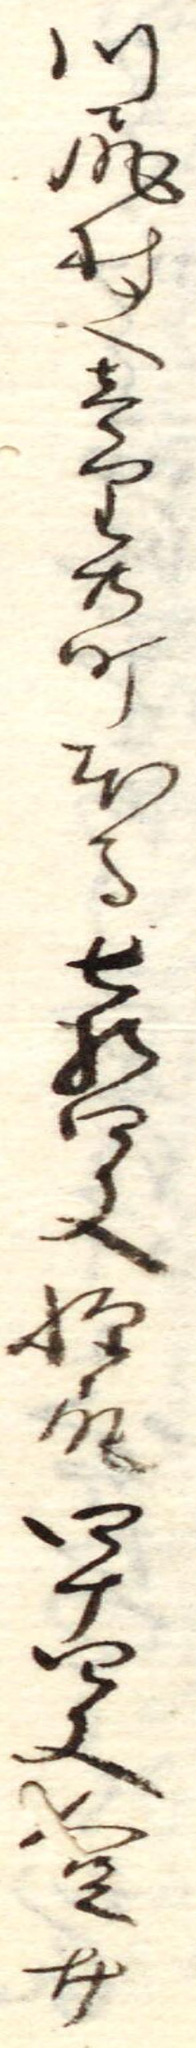川尻村へ壱里廿町本馬七拾四文軽尻四十四文人足廿
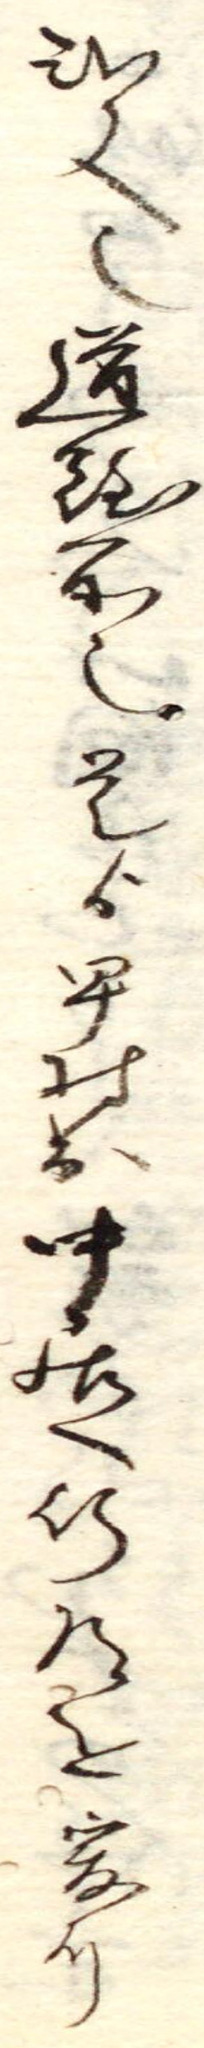弐文也道難所也是ゟ甲村出中居へ行道を爰に
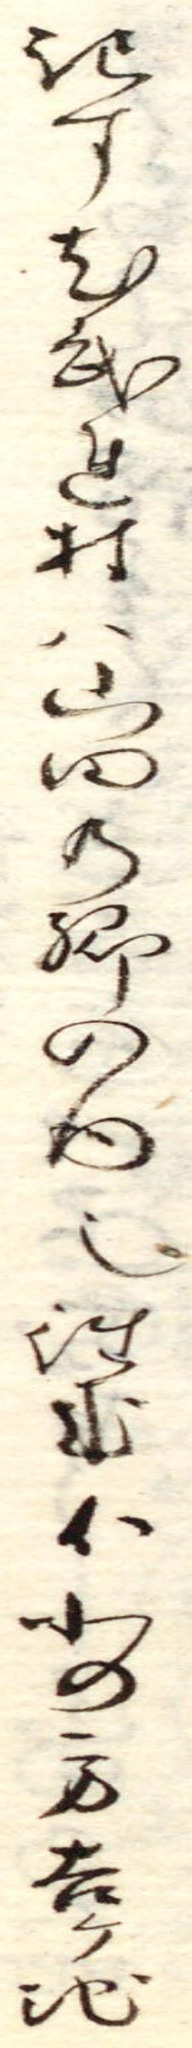記す尤武連村は山田の郷の内也往来は北の方よそ吉ヶ池
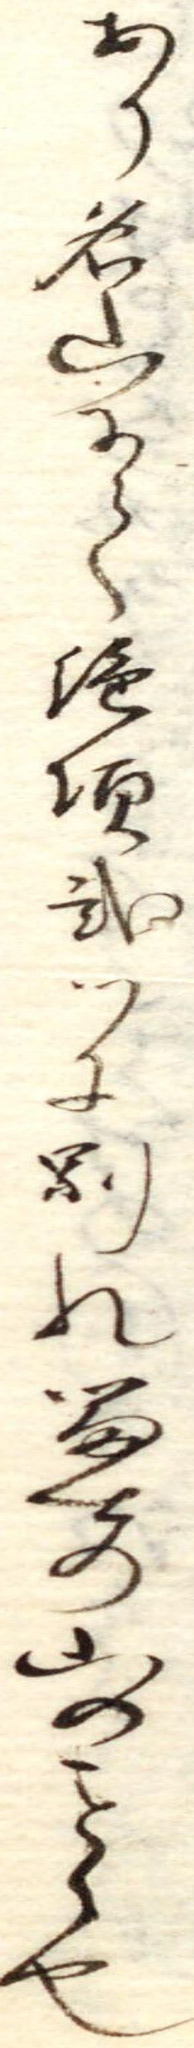あり名山にて絶頂弐ツに別れ留との山のことく也
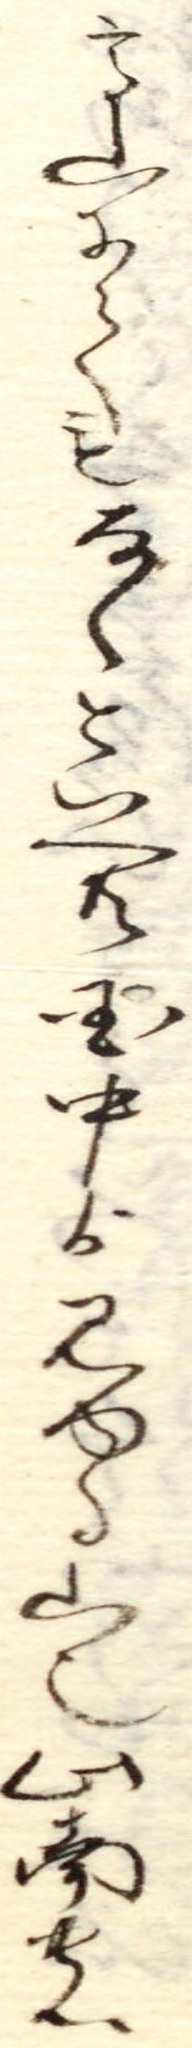高山にてもなくといへ共国中ゟ見ゆる山也此南の
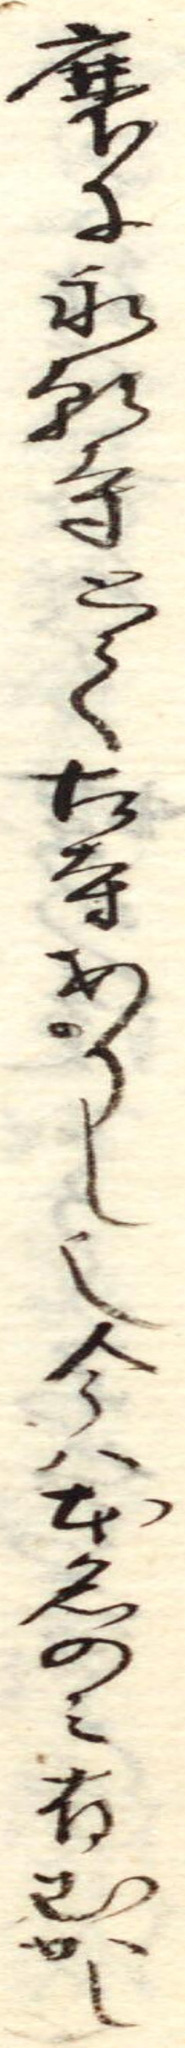鹿下に永願寺とて古寺ありし也今は本名のみ有むかし
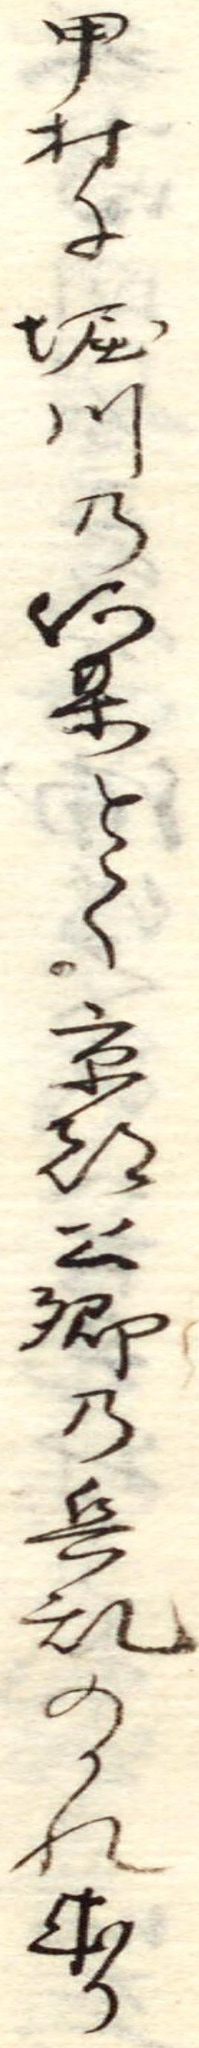甲村に堀河の何某とて京都公卿の兵乱のかれ来り
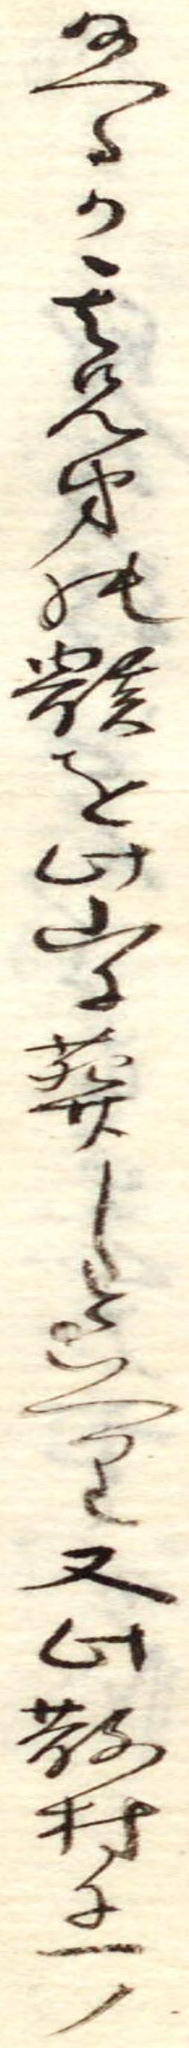給へるか其兄弟の亡骸を此山に葬しといへり又此散村に一ノ
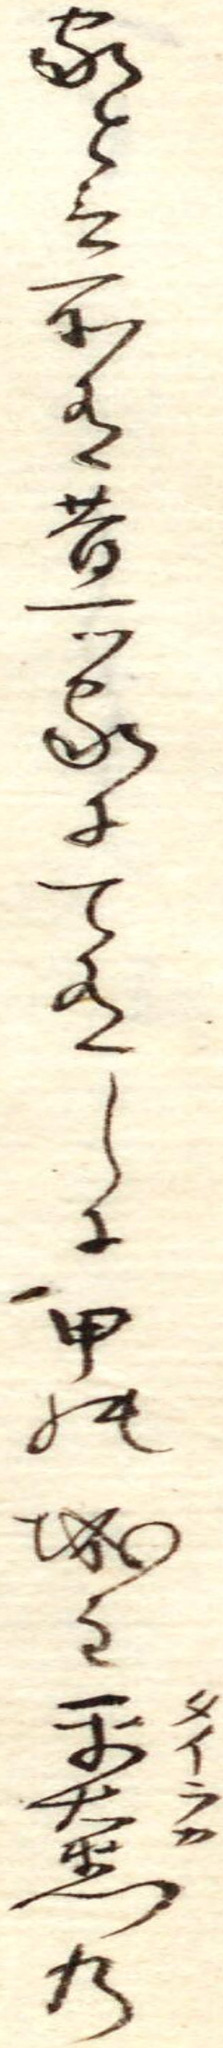家とは所有昔一ッ家にて有しに甲の城主平右衛門の
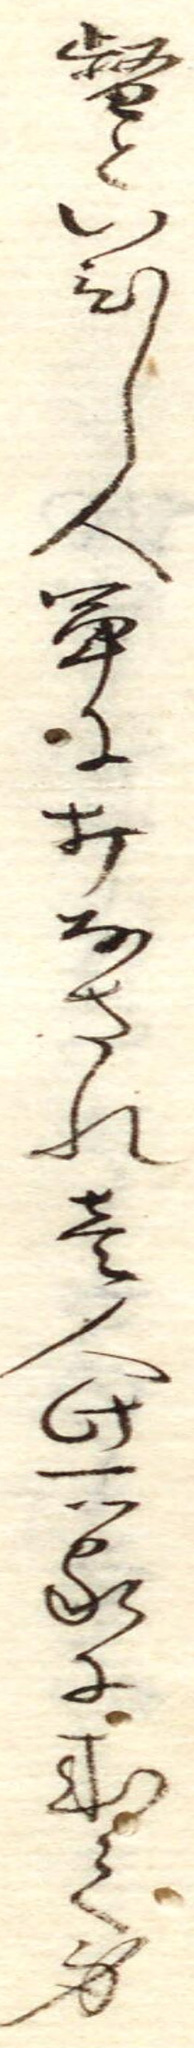督といひし人軍に打ちなされ壱人此一ッ家に来て身
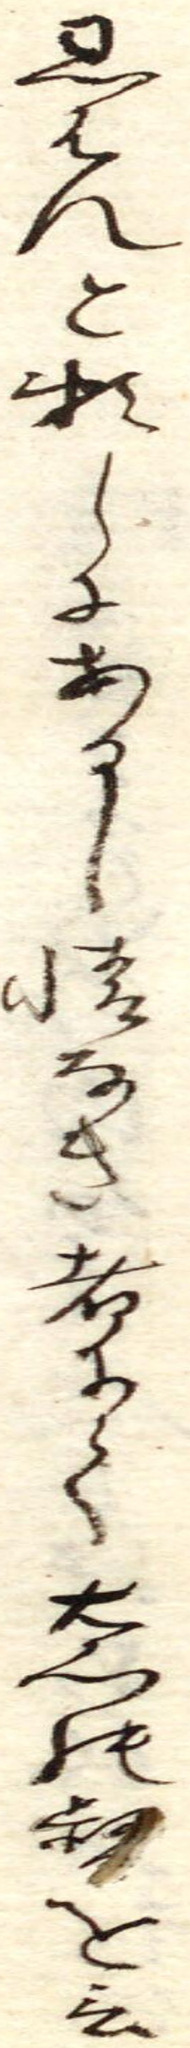忍はんと頼しにあるし情なき者にて右衛門督を言
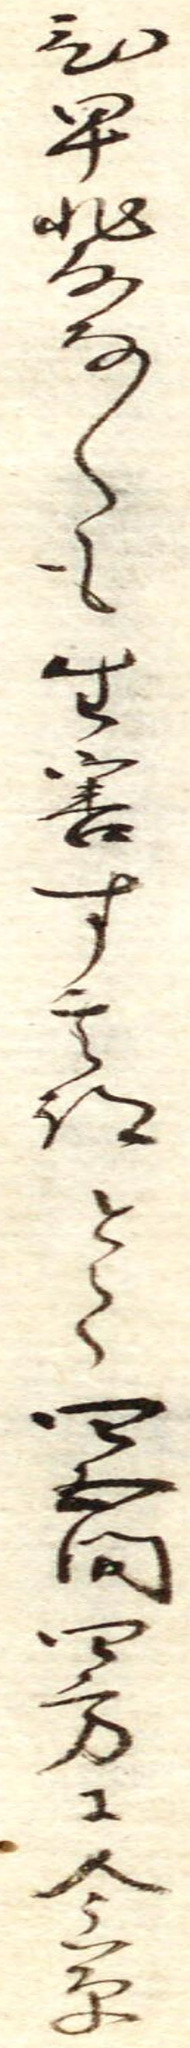ひ甲斐なしと生害す其跡とて四五間四方に今草
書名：能登名跡誌
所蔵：Ishikawa Prefectural Library
